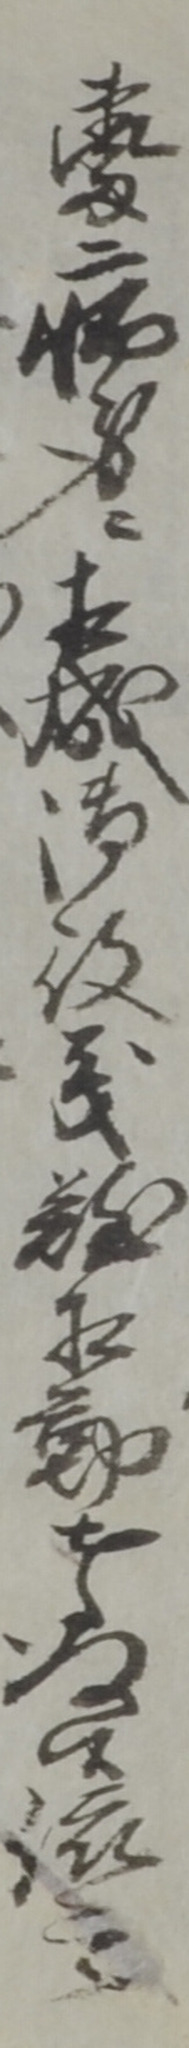処病身ニ相成御役義難相勤奉存候依之
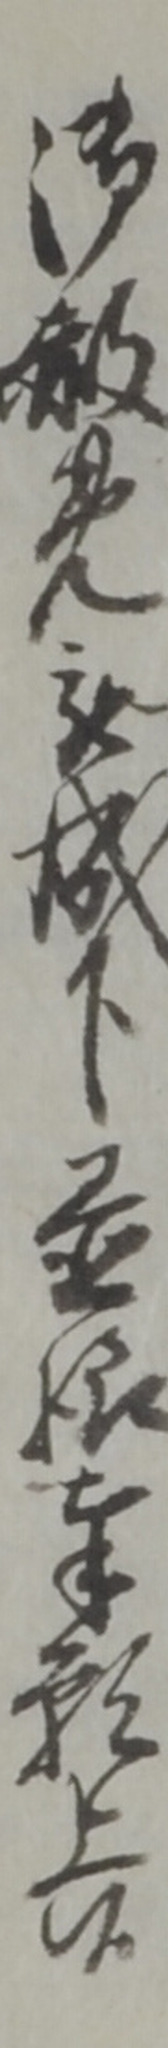御赦免被成下置様奉願上候
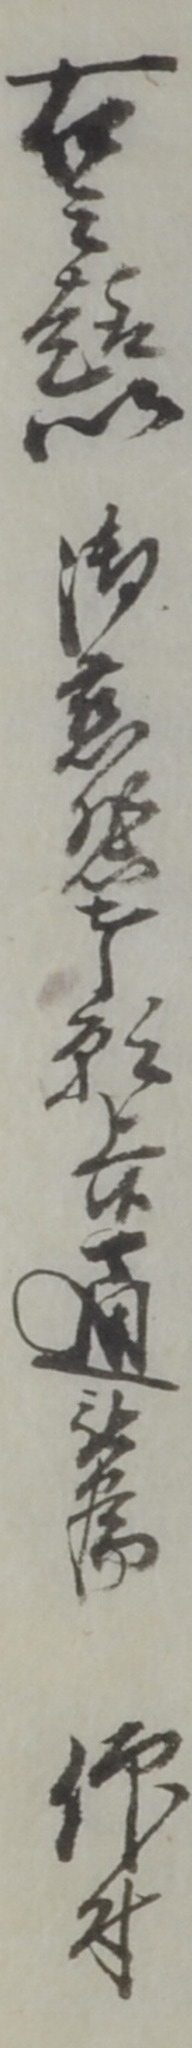右之趣以御慈悲奉願上候通被為仰付

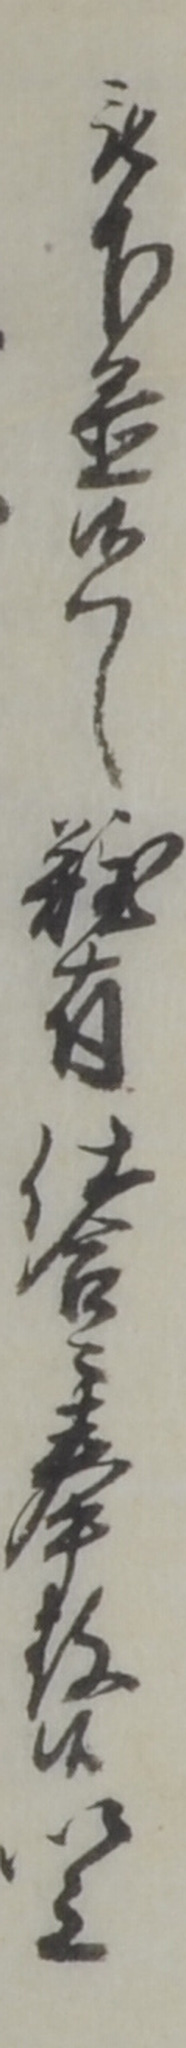被下置候ハヽ難有仕合ニ奉存候以上
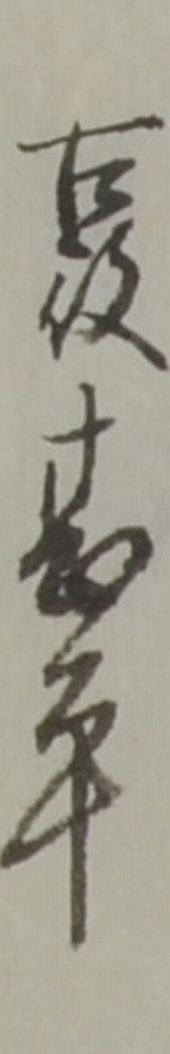右役甚平
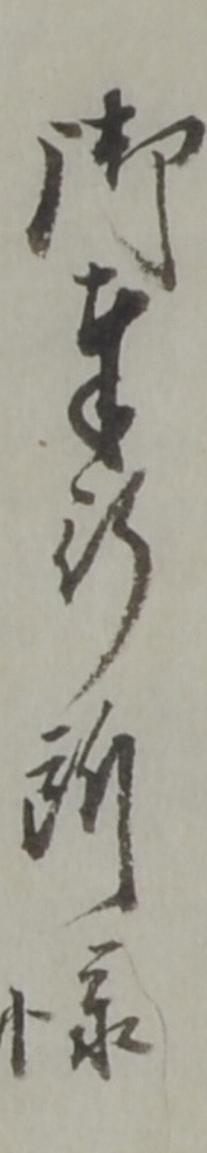御奉行所様
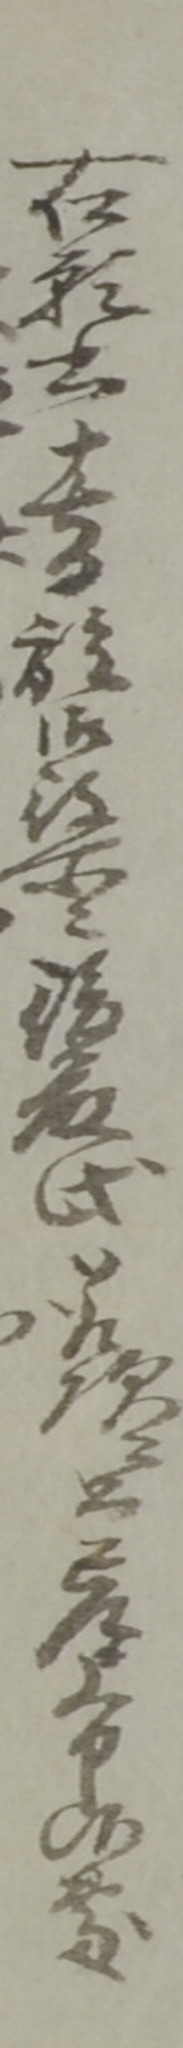右願書十七日於御役所ニ後藤氏御取次ニ而差上申候處
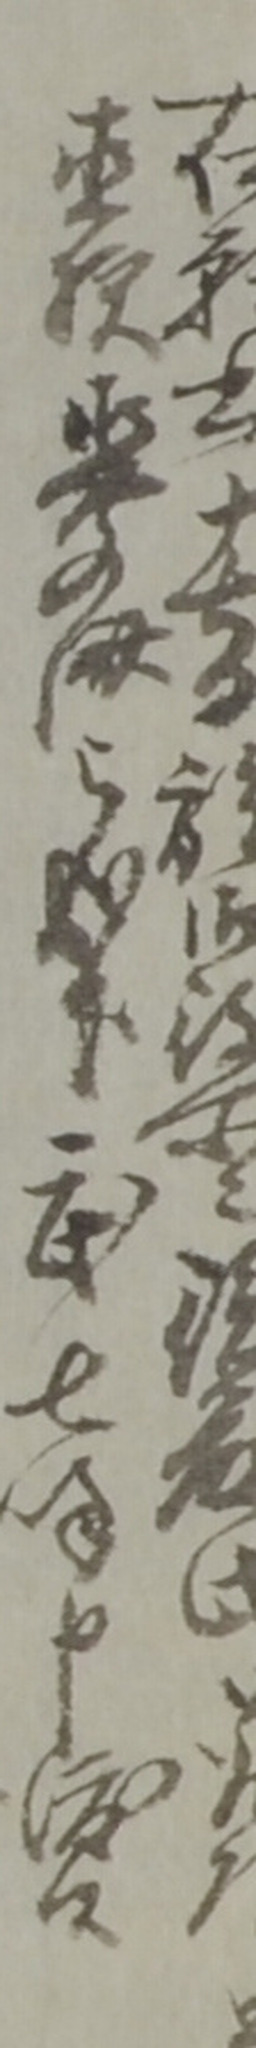直様御聞済被成下武七呼申渡候
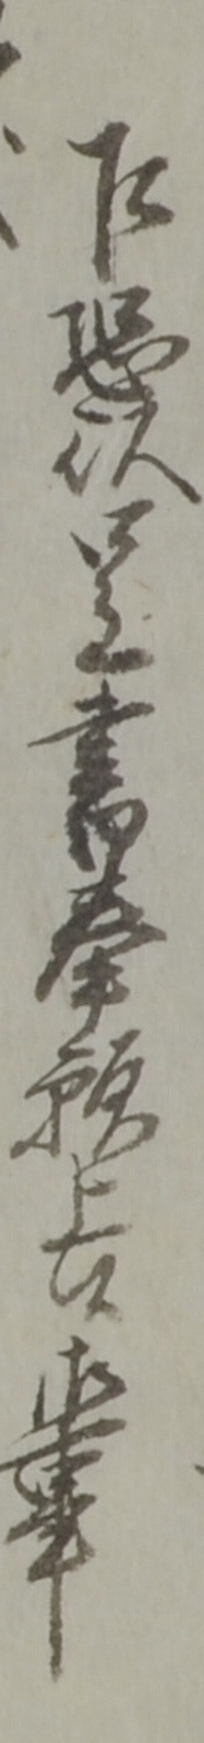乍恐以口上書奉願上候御事
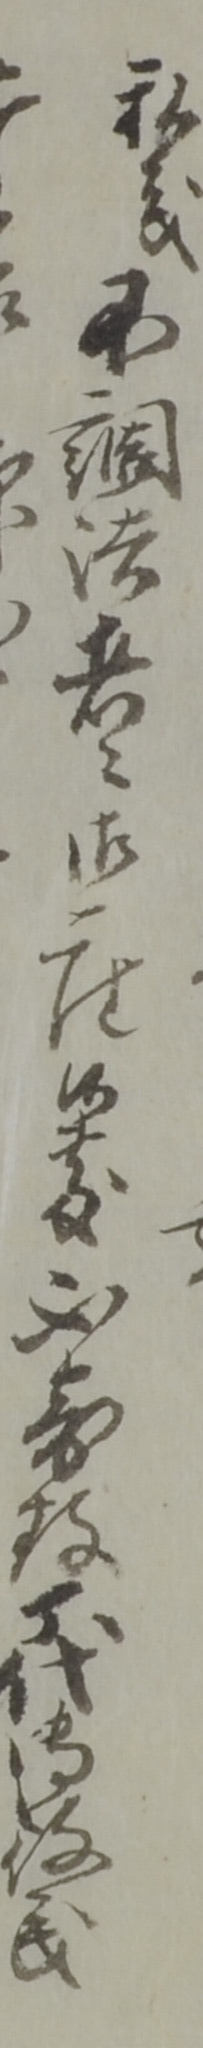私儀不調法者ニ御座候處不寄存丁代御役義
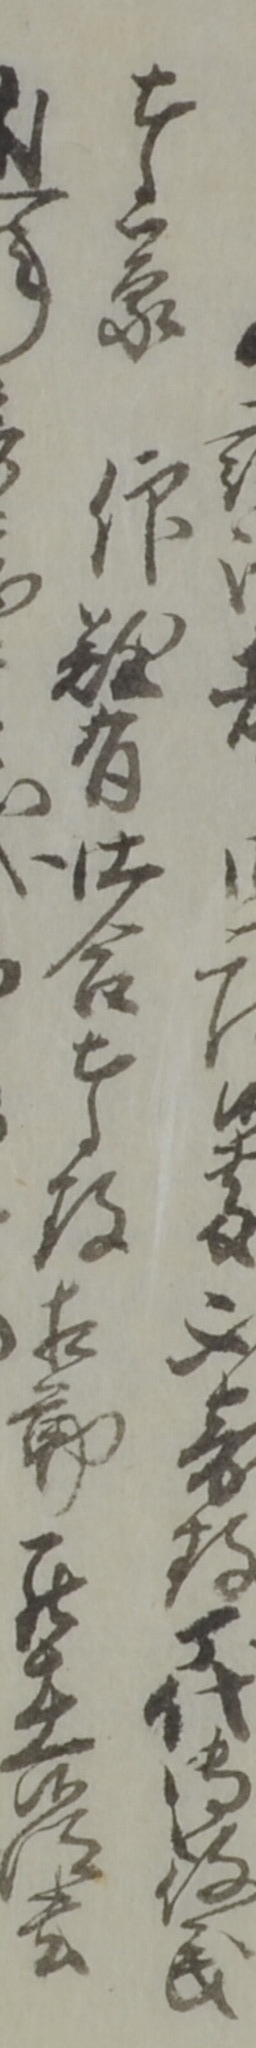奉蒙仰難有仕合奉存相勤罷在候得共
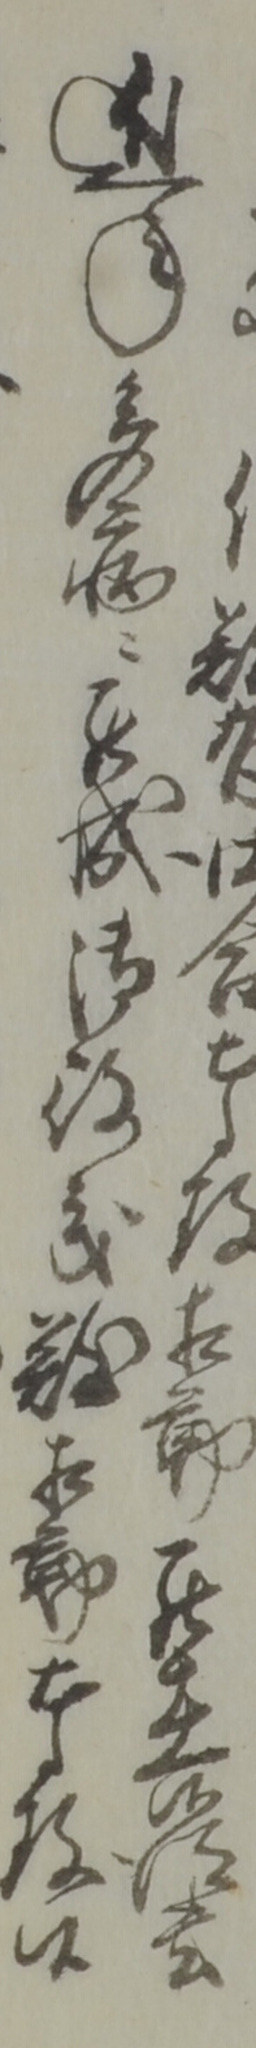近年多病ニ罷成御役義難相勤奉存候
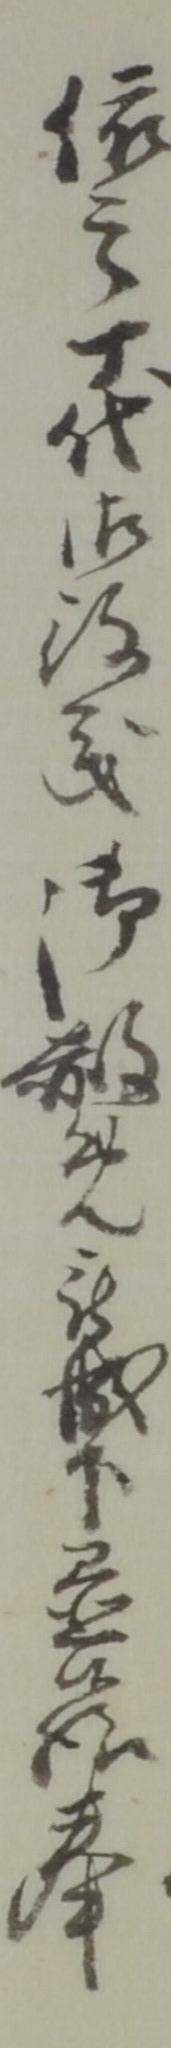依之丁代御役義御赦免被成下置候様奉
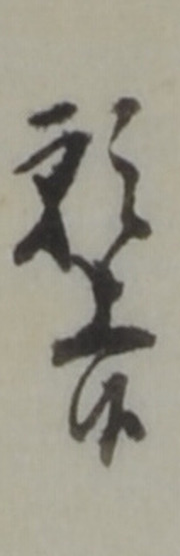願上候
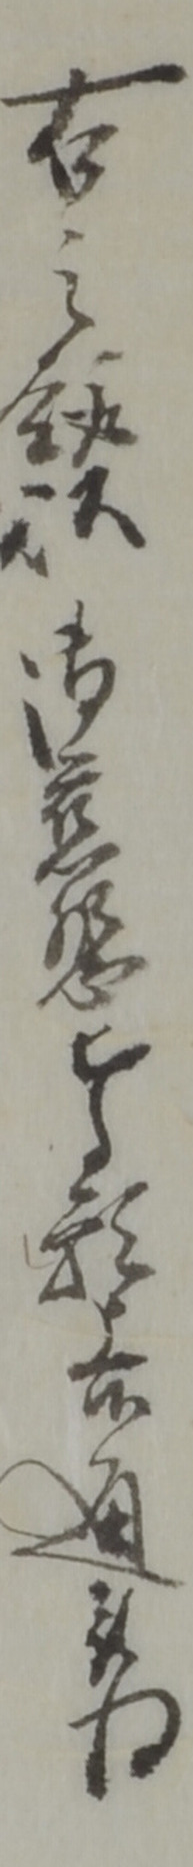右之趣以御慈悲奉願上候通被為仰付
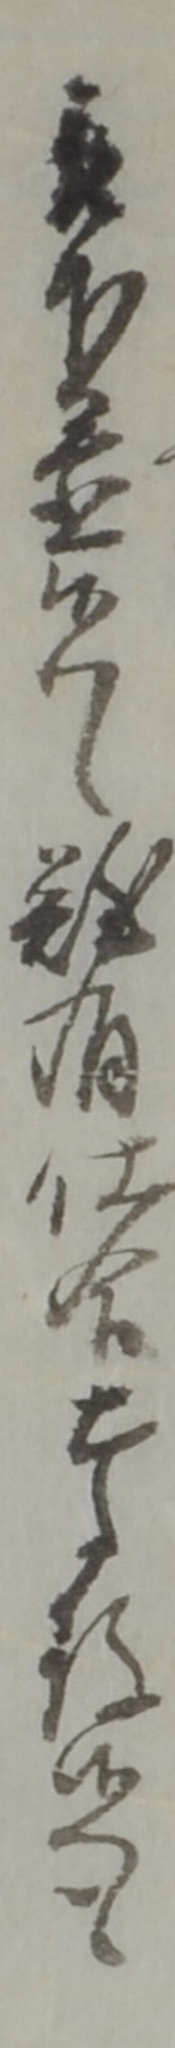被下置候ハヽ難有仕合奉存候以上
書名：諸願書控簿
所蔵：伊那市立高遠町図書館・合同会社AMANE
